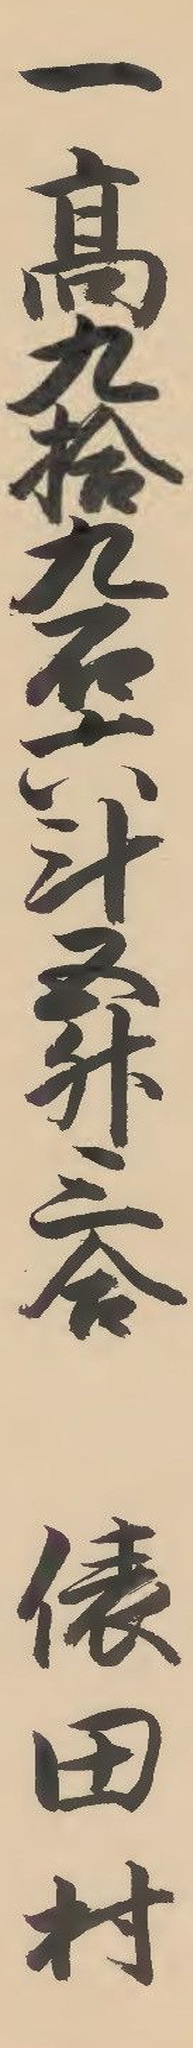一髙九拾九石六斗五升三合俵田村

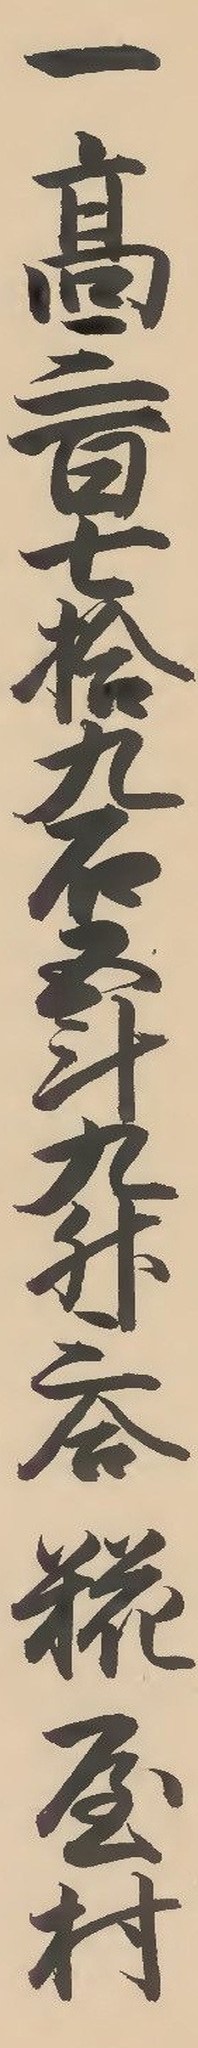一髙三百七拾九石五斗九升三合糀屋村
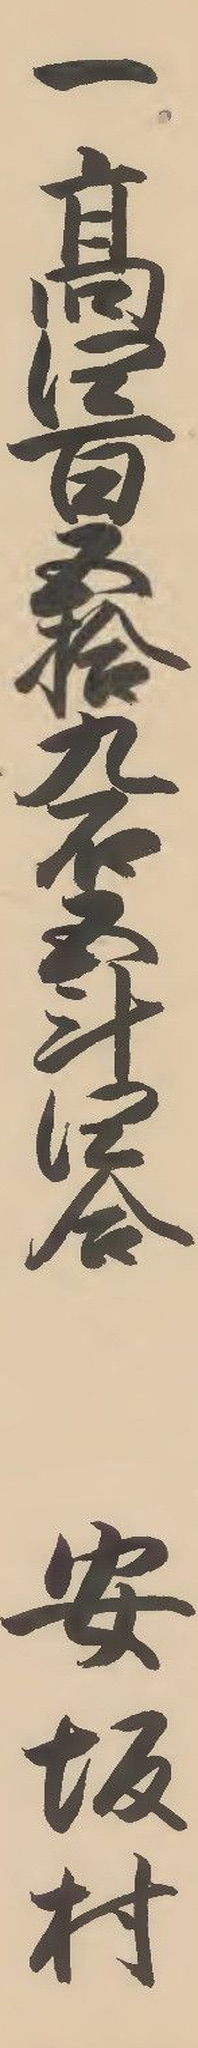一髙四百五拾九石五斗四合安坂村
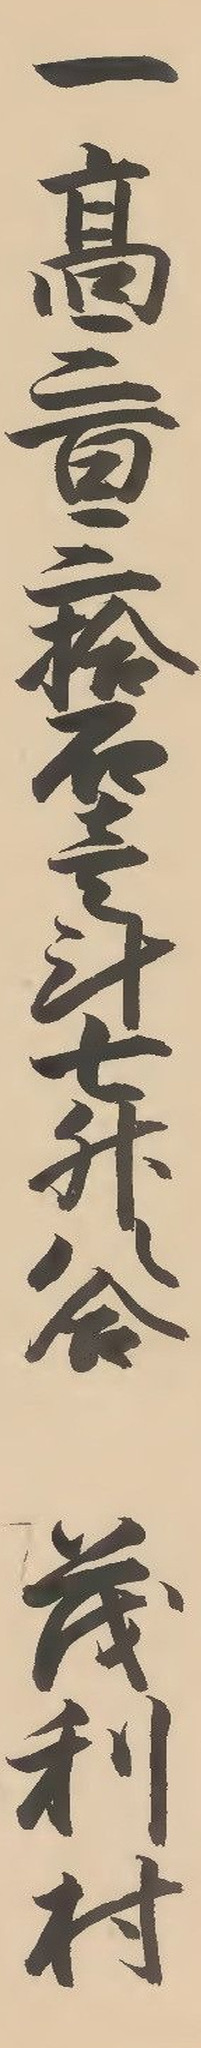一髙三百三拾石壱斗七升八合茂利村
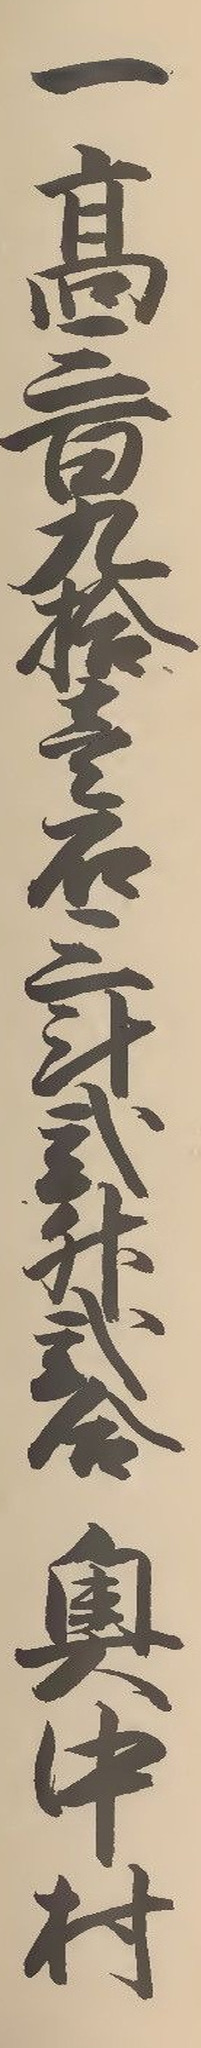一髙三百九拾壱石三斗弐升弐合奥中村
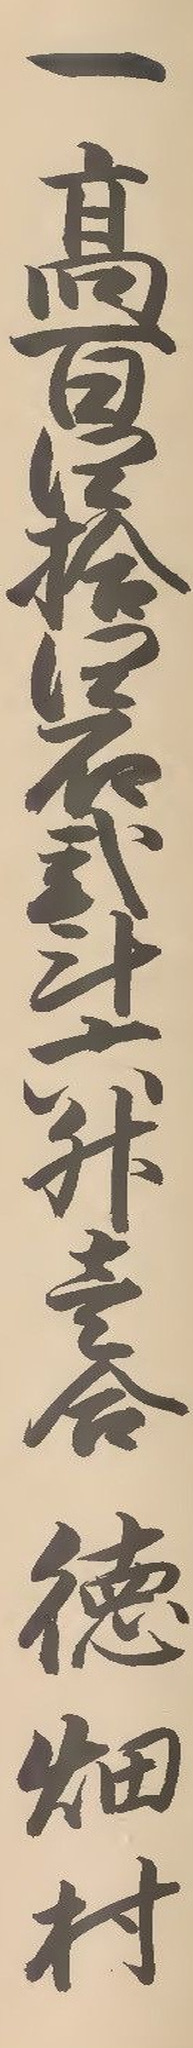一髙百四拾四石弐斗六升壱合徳畑村
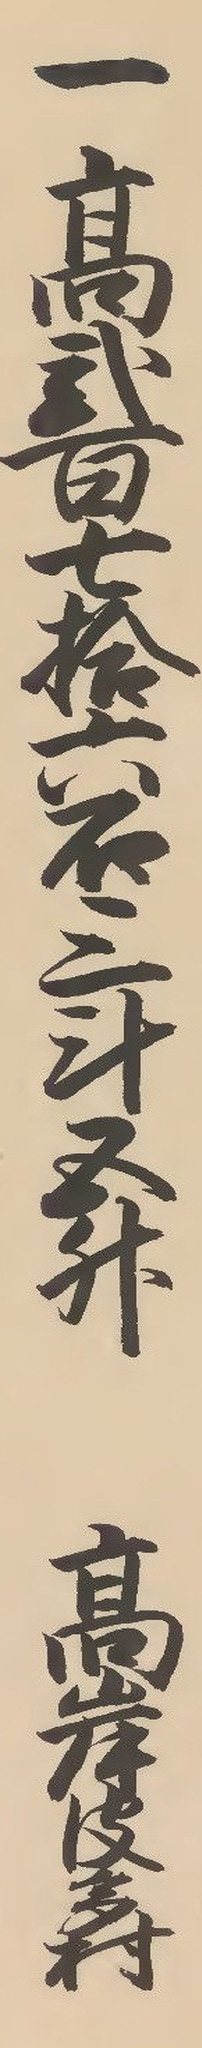一髙弐百七拾六石三斗五升高岸皮多村
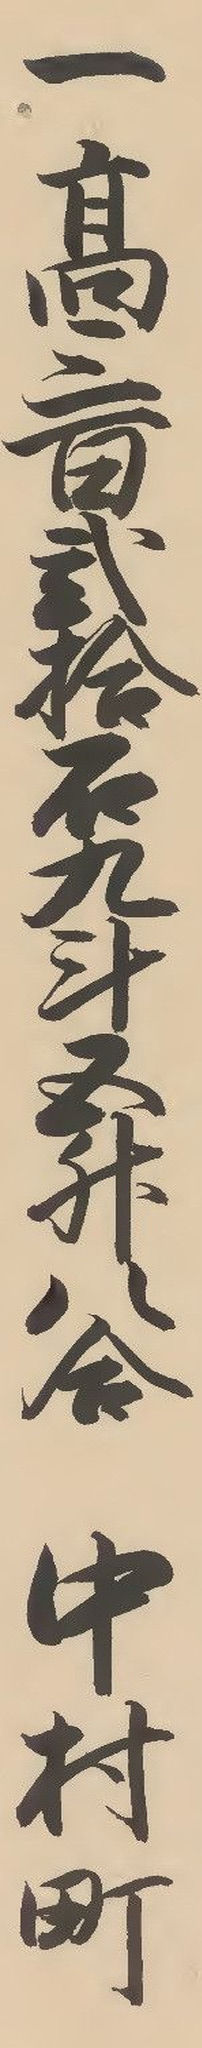一髙三百弐拾石九斗五升八合中村町
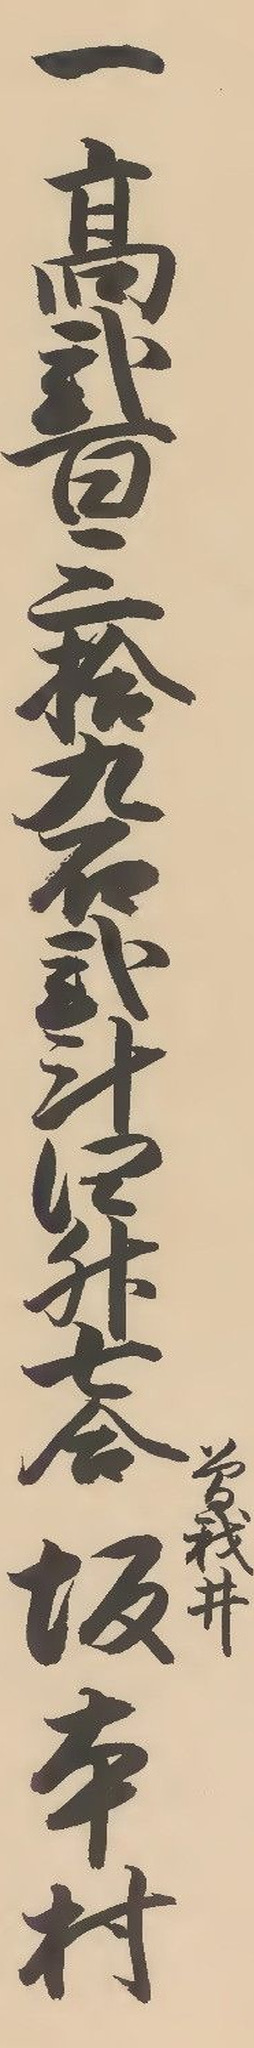一髙弐百三拾九石弐斗四升七合坂本村

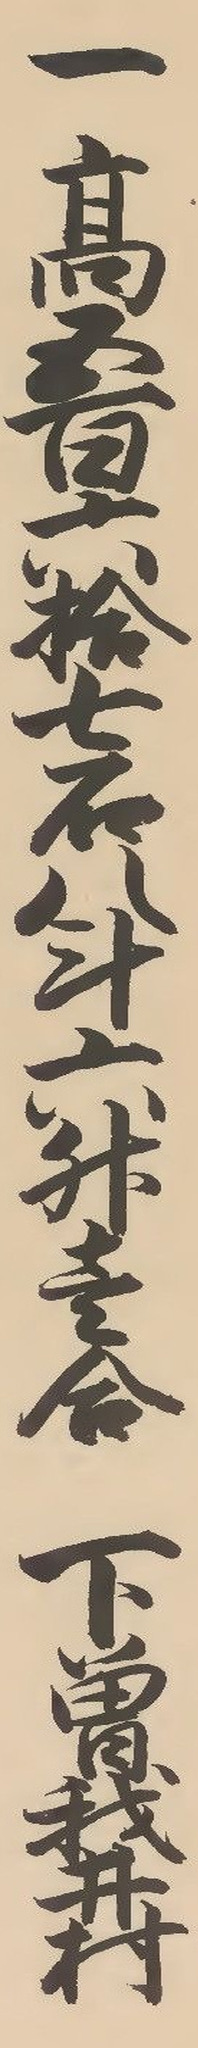一髙五百六拾七石八斗六升壱合下曽我井村
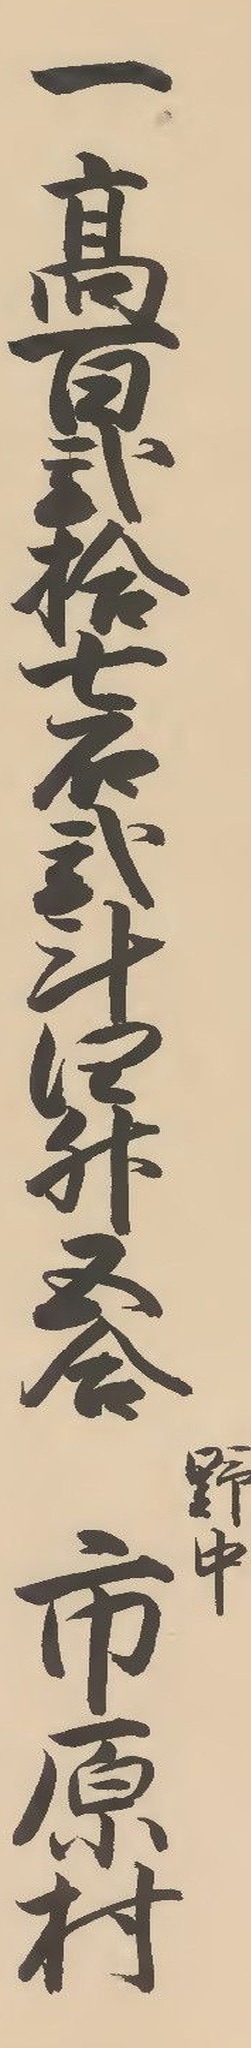一髙百弐拾七石弐斗四升五合市原村
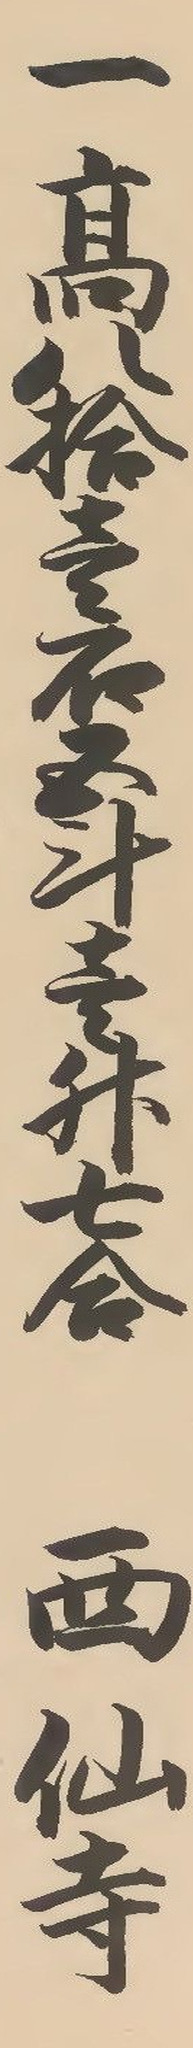一髙八拾壱石五斗壱升七合西仙寺
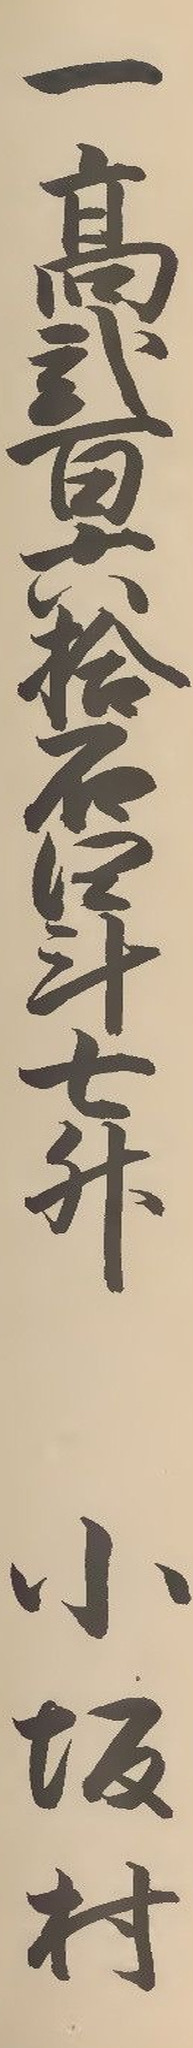一髙弐百六拾石四斗七升小坂村
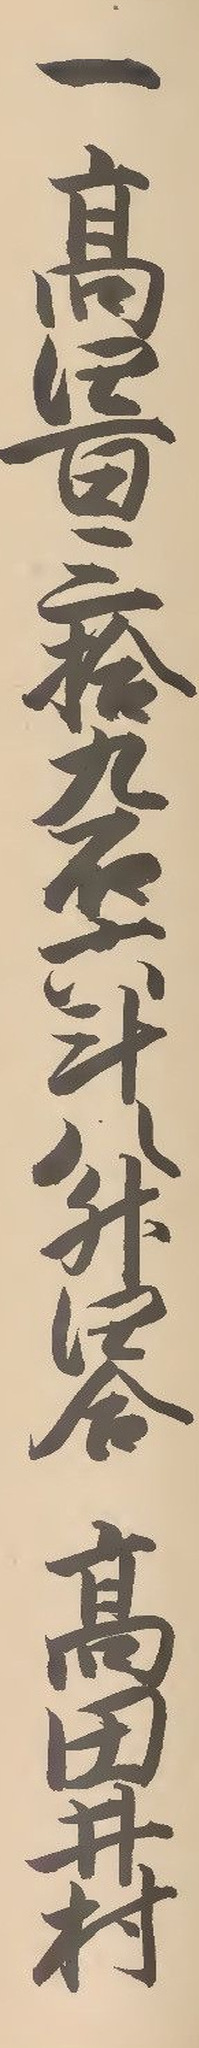一髙四百三拾九石六斗八升四合髙田井村
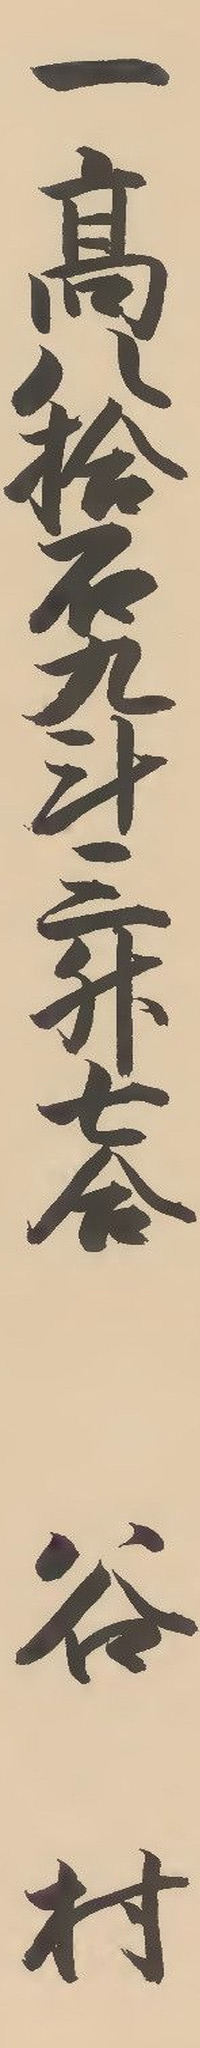一髙八拾石九斗三升七合谷村
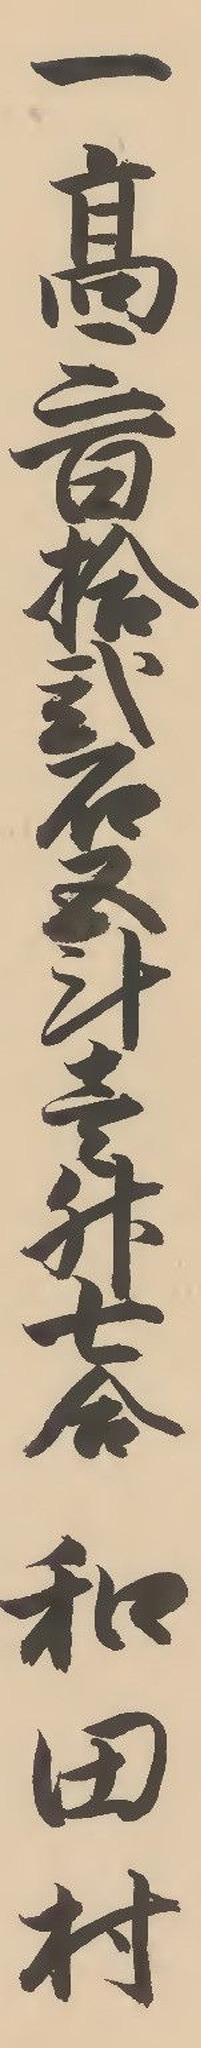一髙三百拾弐石五斗壱升七合和田村
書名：播磨国郷帳
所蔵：国立公文書館 National Archives of Japan
